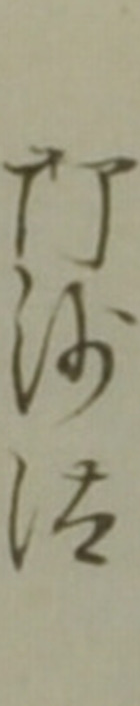御沙汰
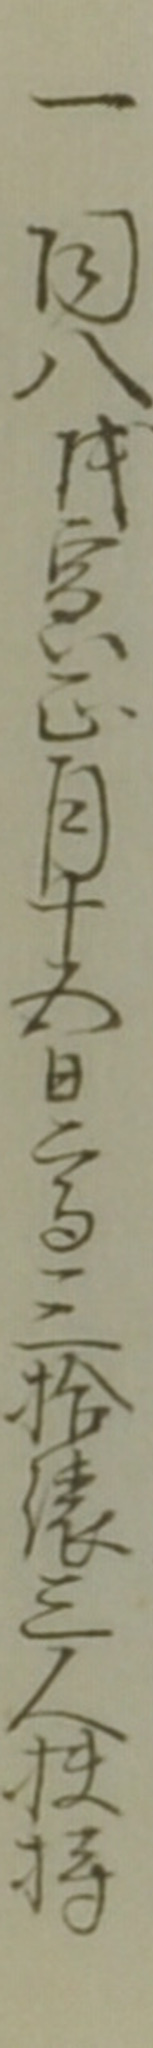一同八戊寅正月十五日高三拾俵三人扶持
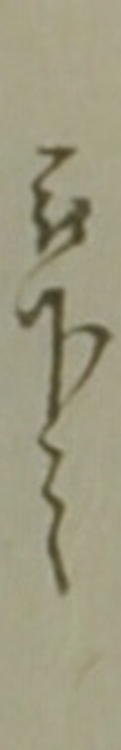被下候
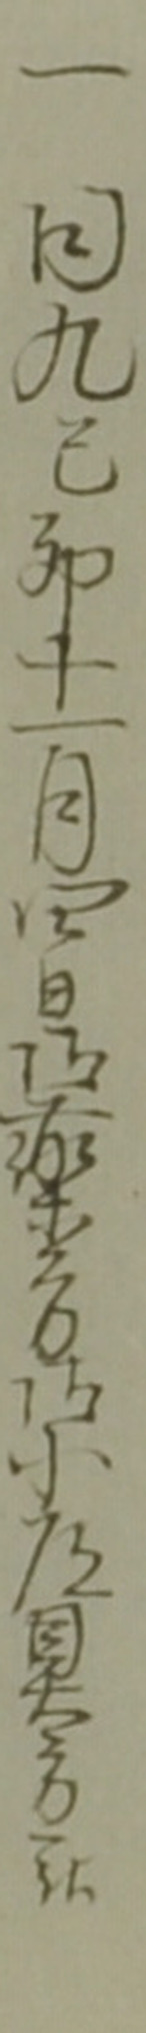一同九己卯十一月四日御薬方小道具方被
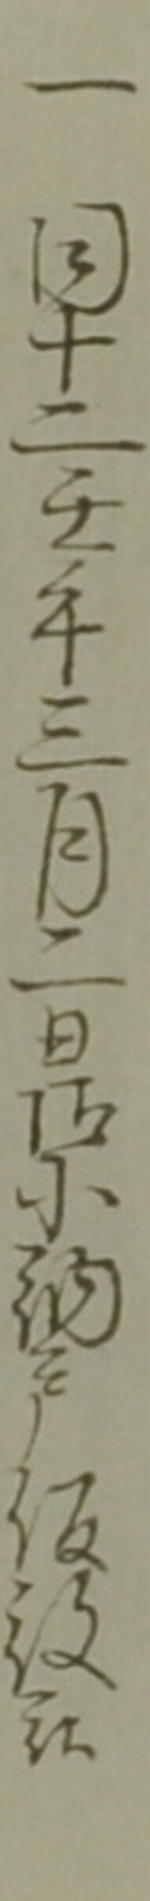一同十二壬午三月二日御小納戸仮役被
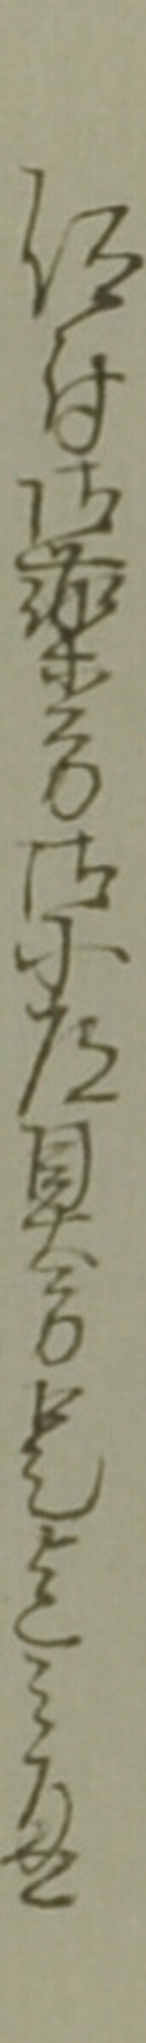仰付御薬方御小道具方是迄之通
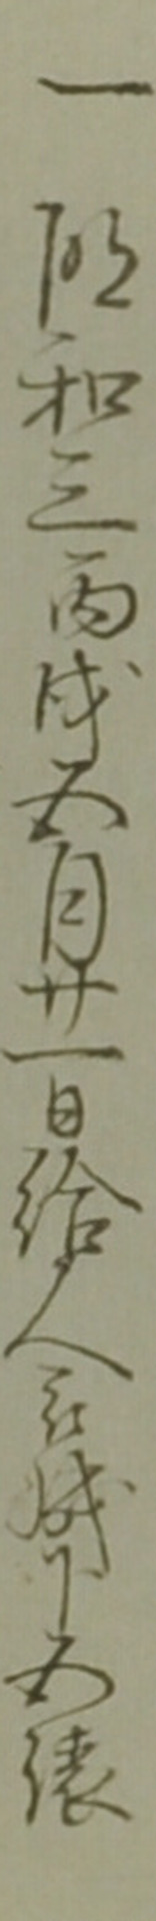一明和三丙戊五月廿一日給人被成下五俵
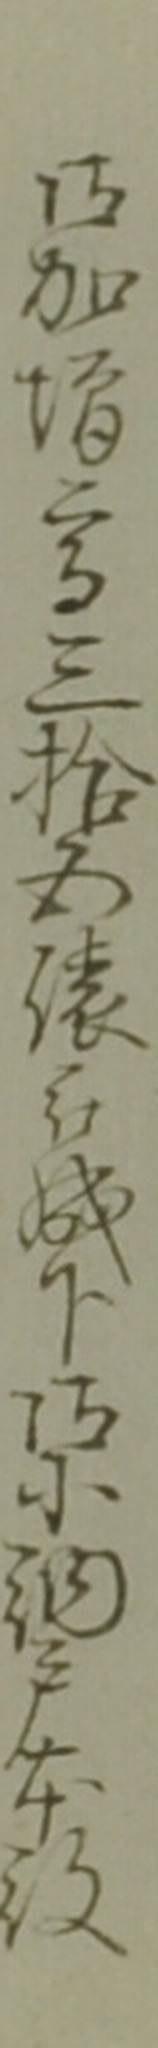御加増高三拾五俵被成下御小納戸本役
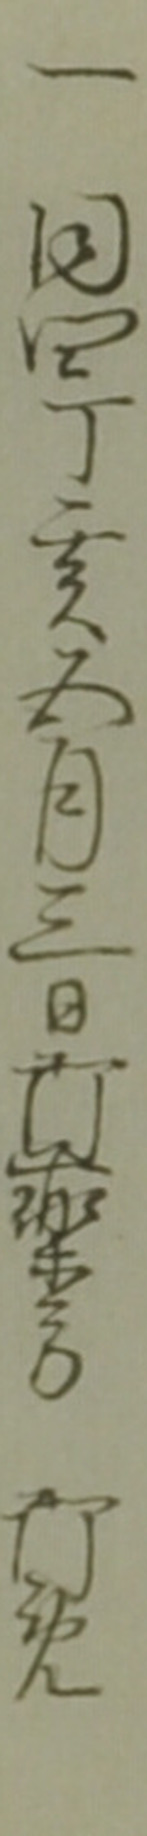一同四丁亥五月三日御薬方御免
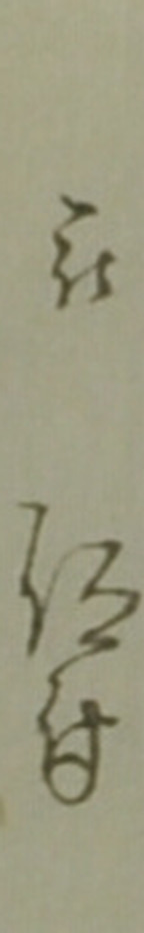被仰付
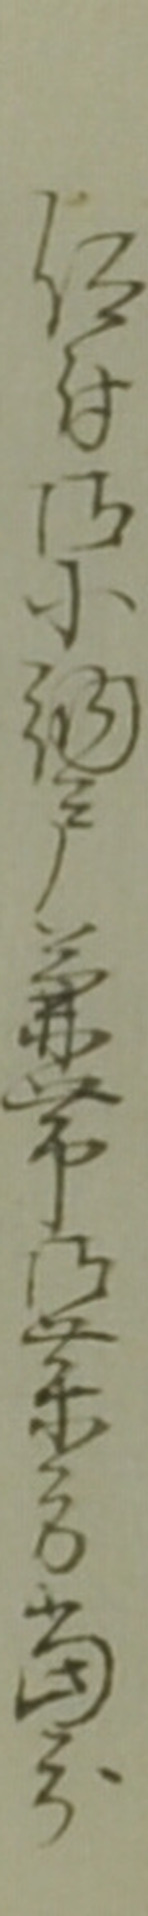仰付御小納戸兼帯御薬方当分
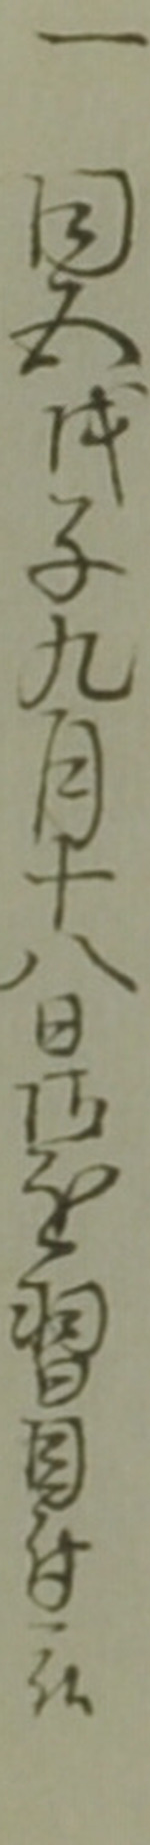一同五戊子九月十八日御近習目付被
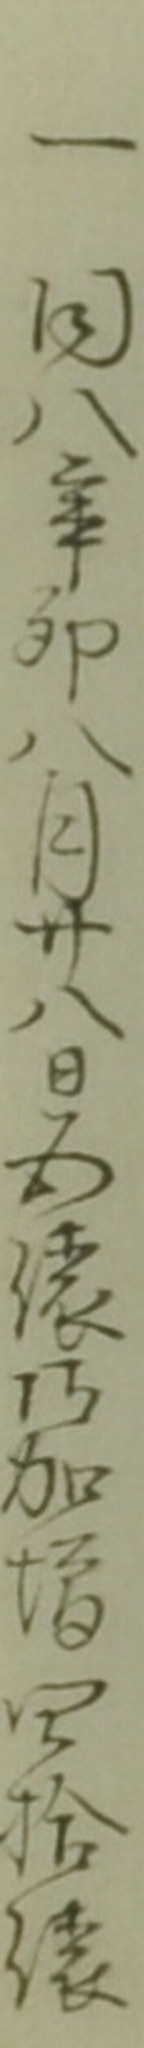一同八辛卯八月二十八日五俵御加増四拾俵
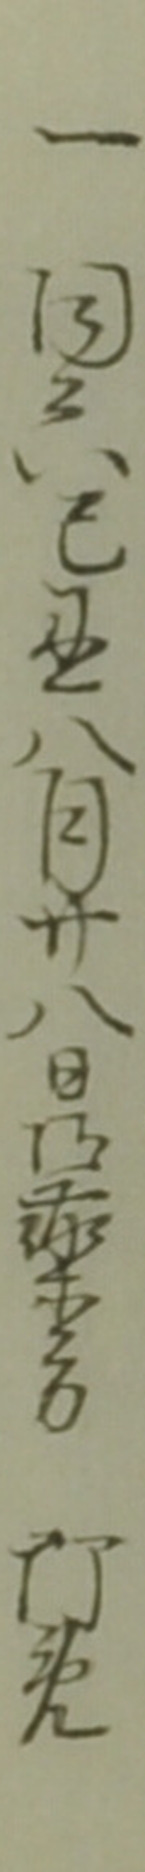一同六己丑八月廿八日御薬方御免
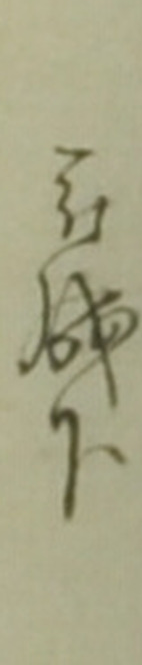被成下

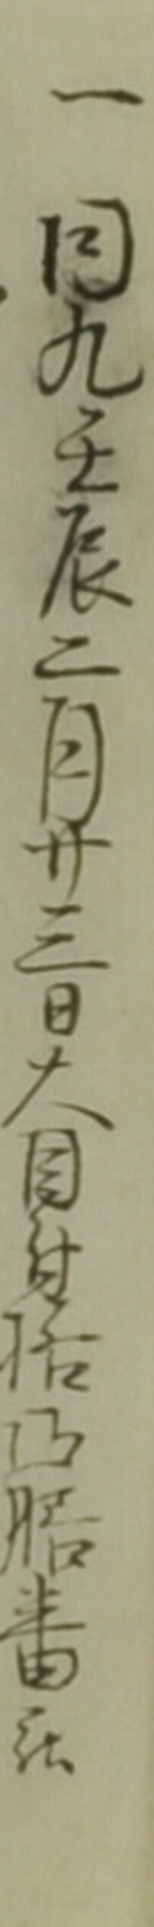一同九壬辰二月廿三日大目付格御膳番被
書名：給人諸士勤仕録（三）
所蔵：伊那市立高遠町図書館・合同会社AMANE
